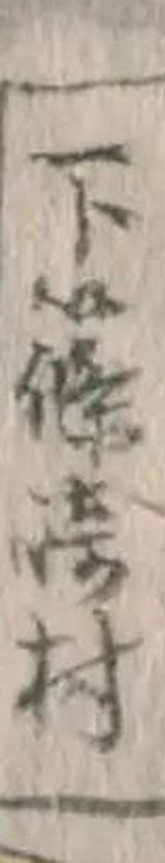下篠崎村
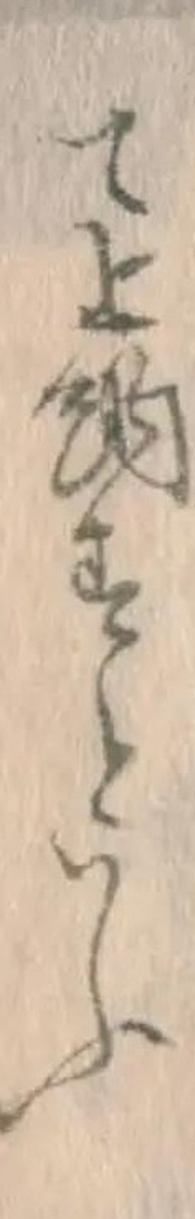て上納すといふ
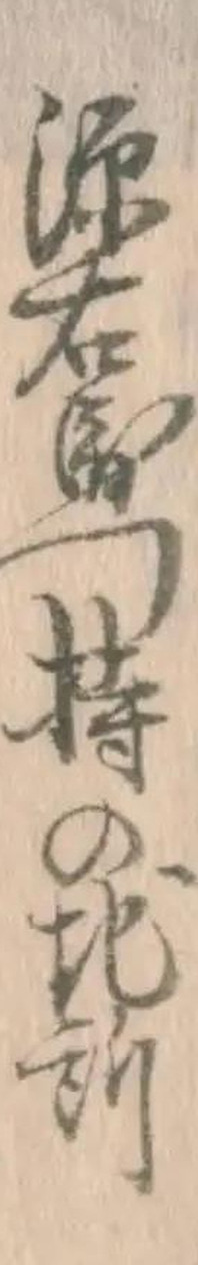源右衛門持の地所
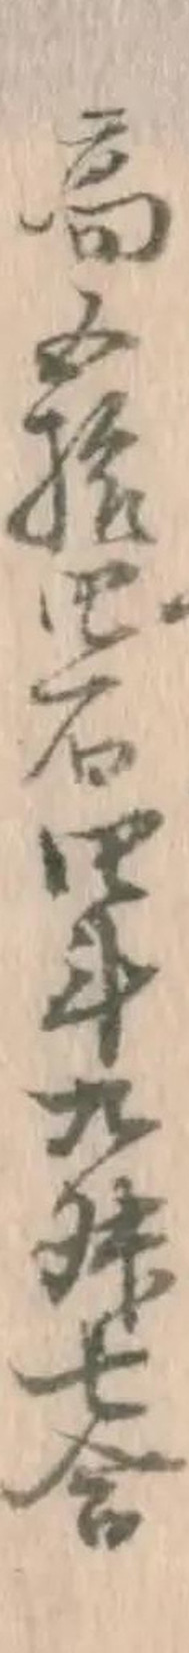高五拾四石四斗九舛七合
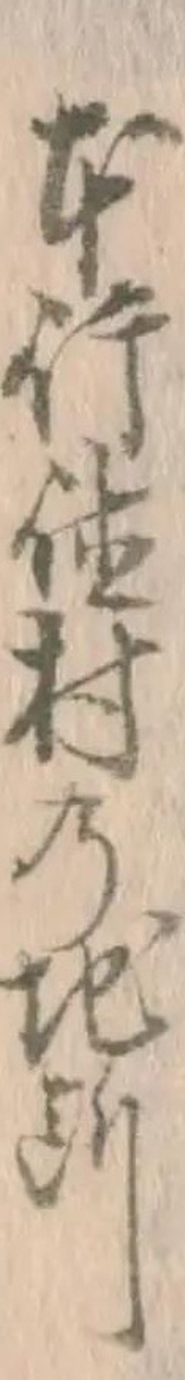本行徳村の地所
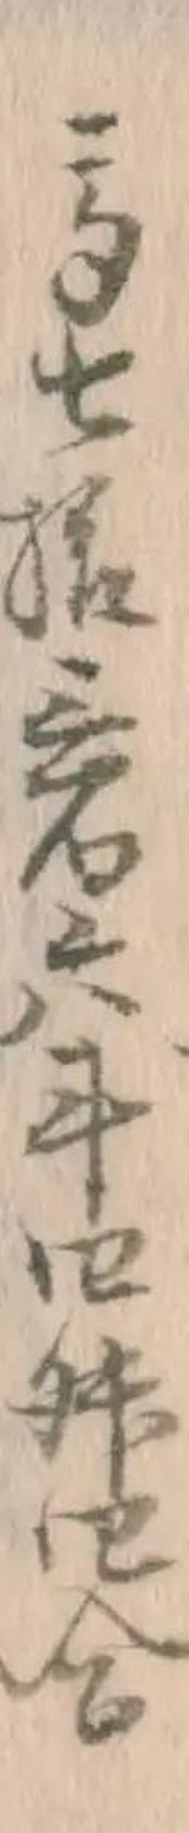高七拾三石六斗四舛四合
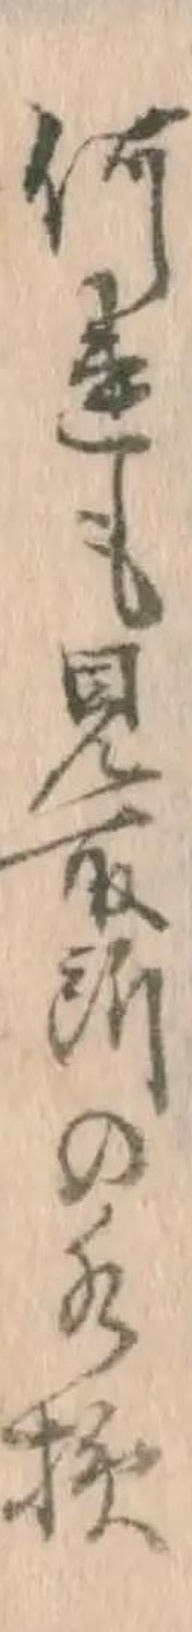何れも見取所の水挽
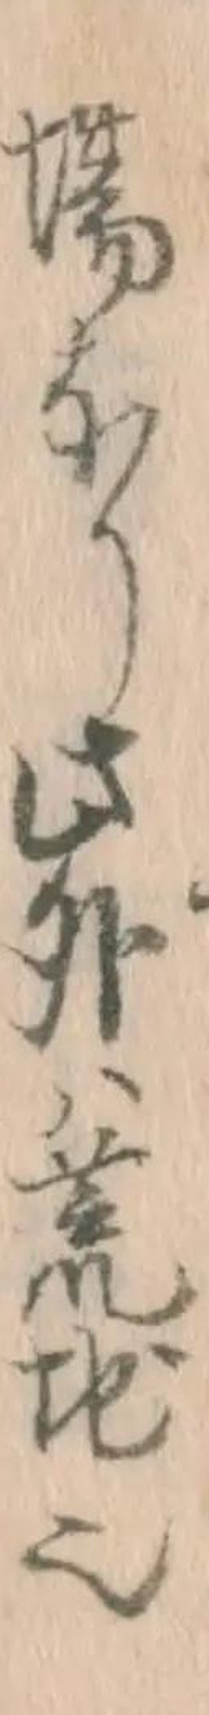場なり此外は荒地也
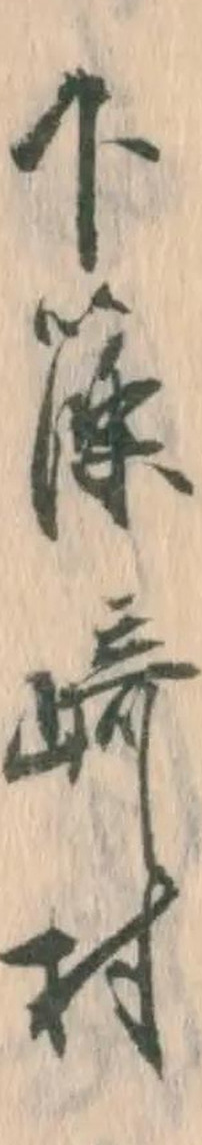下篠崎村
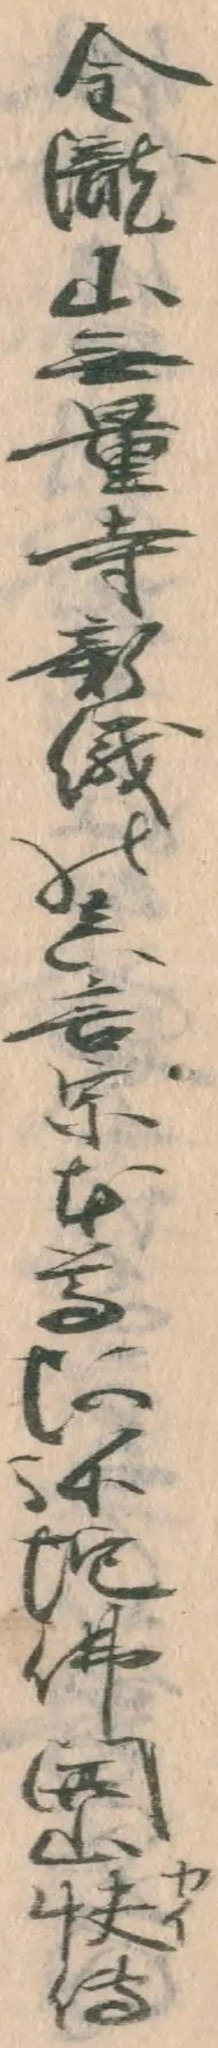金滝山無量寺新儀の真言宗本尊阿弥陀仏開山快伝
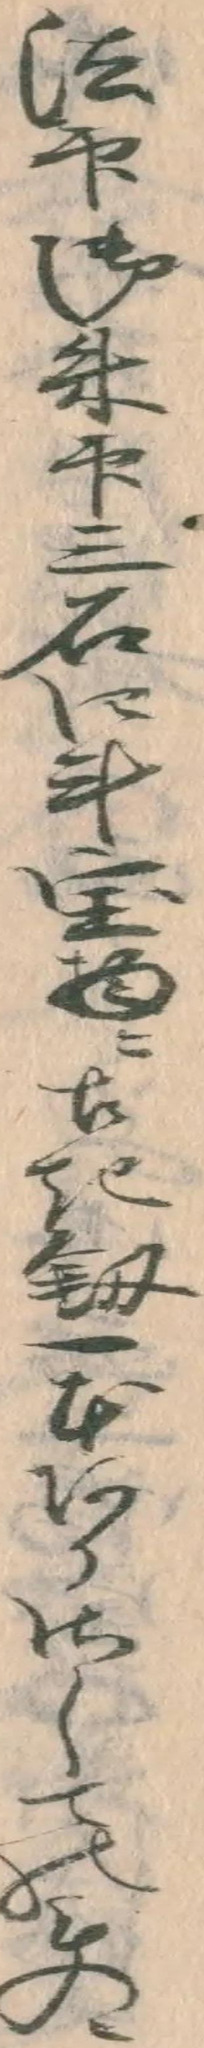法印御朱印三石四斗宝物に古き剣一本ありさしてのものに
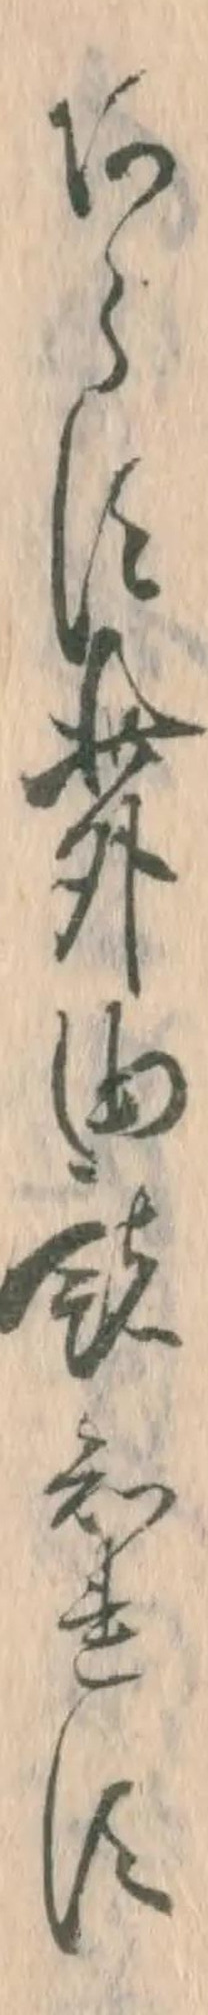あらす此外由諸知れす
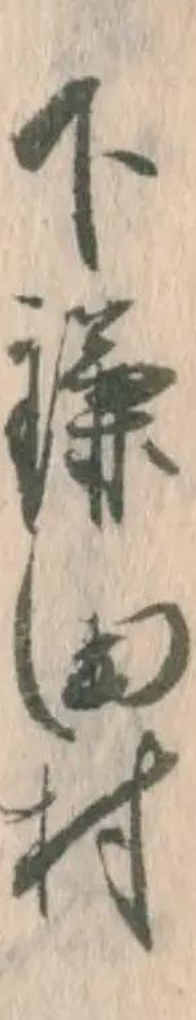下鎌田村
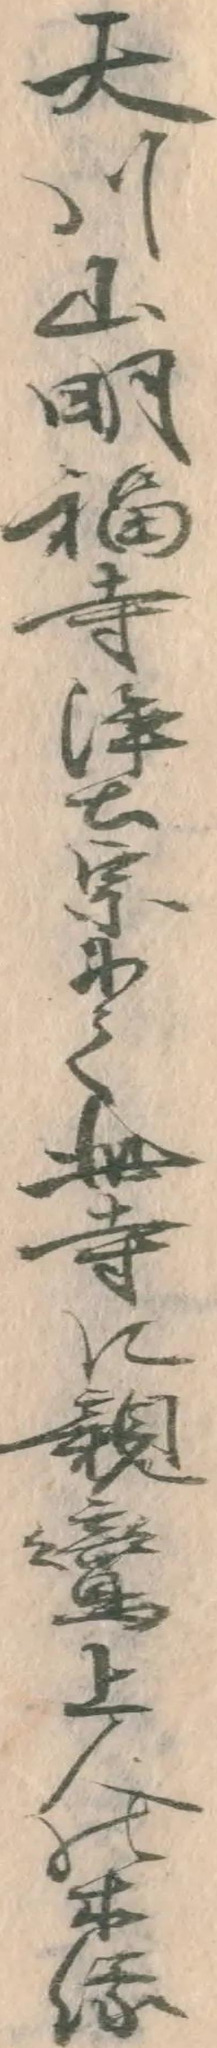天川山明福寺浄土宗にて此寺に親鸞上人の木像
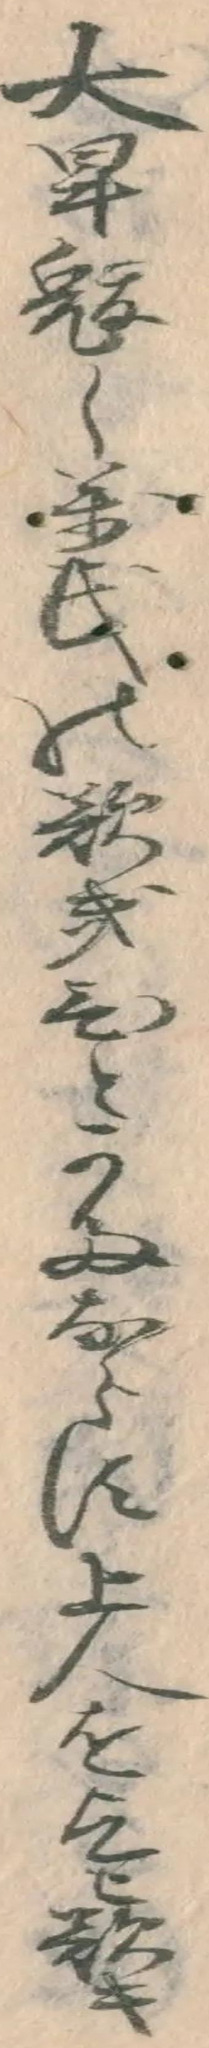大旱魃し万民の歎きひとかたならす上人を乞ひ歎き
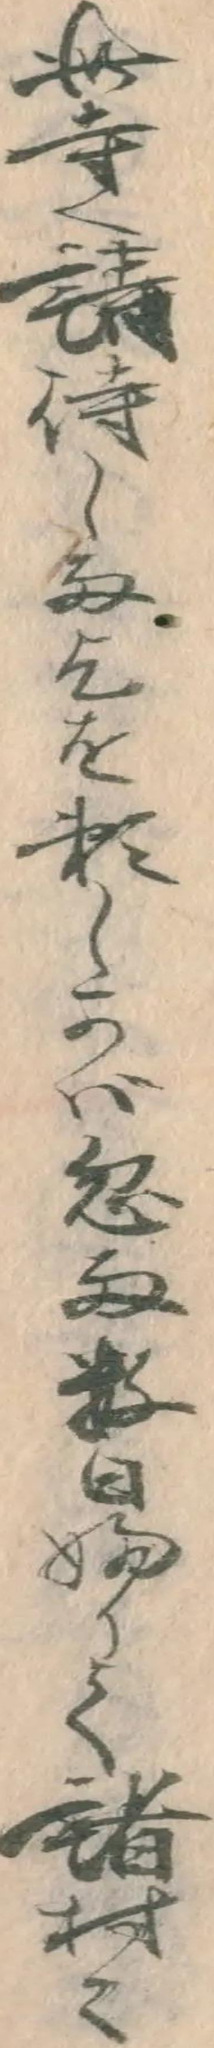此寺へ請待し雨乞を頼しかば忽雨数日ふりて諸村々
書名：四神地名録 6巻. [4]葛飾郡
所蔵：国立国会図書館 National Diet Library, JAPAN
